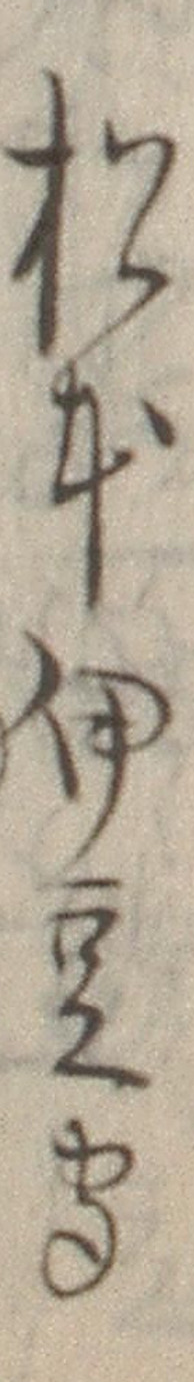松本伊豆守
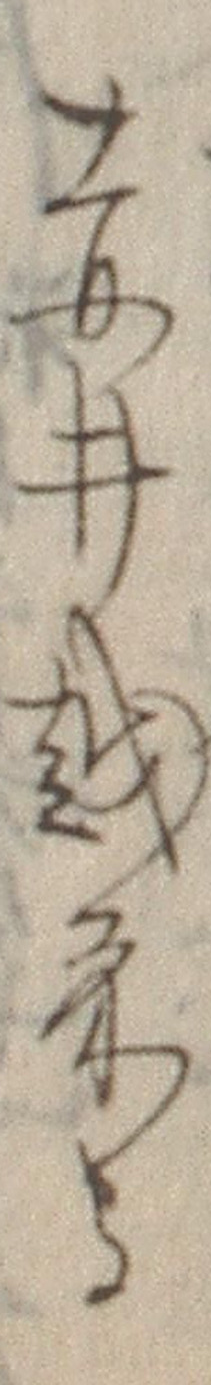赤井越前守
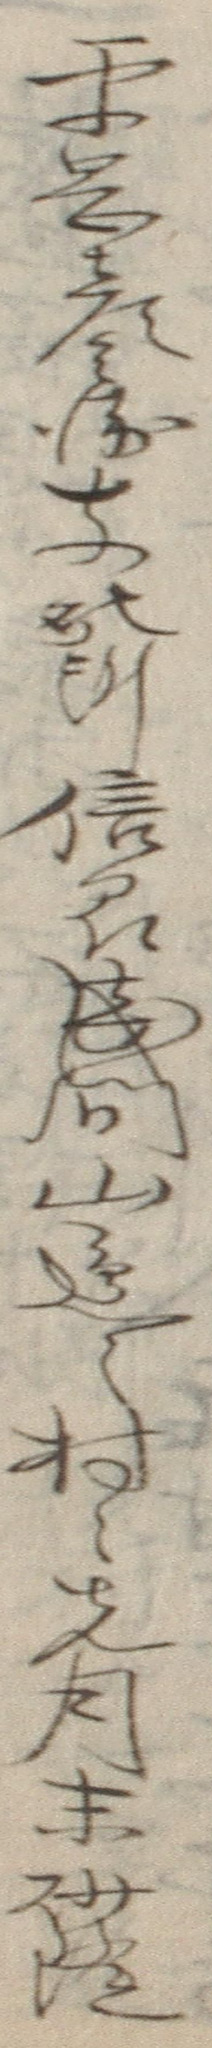平岡彦兵衛支配所信州浅間山辺之村々先月未砂降
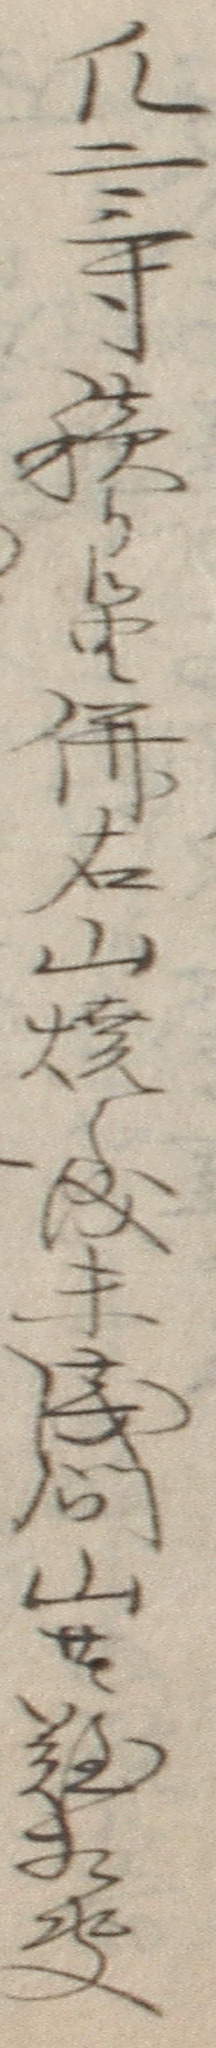凡二三寸積り候由併右山焼候儀未浅間山は難相決
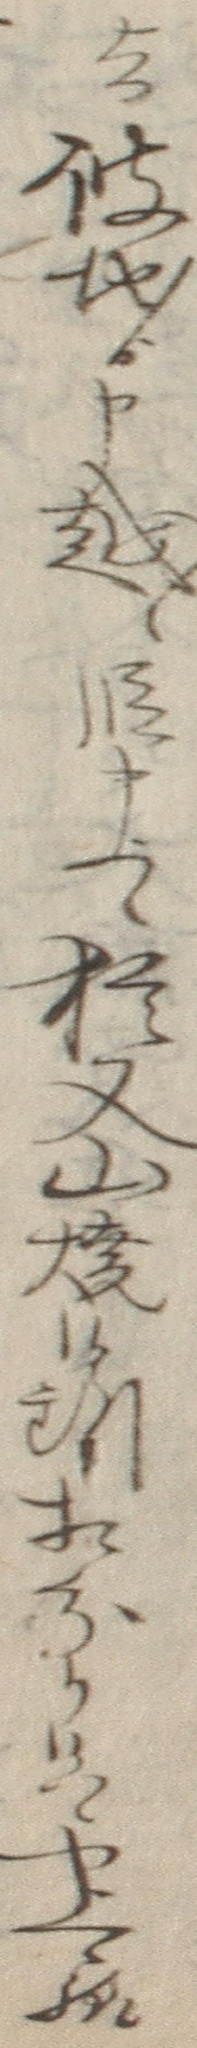旨彼地ゟ申越候段申上候猶又山焼候所相分り候ハゝ申上候様
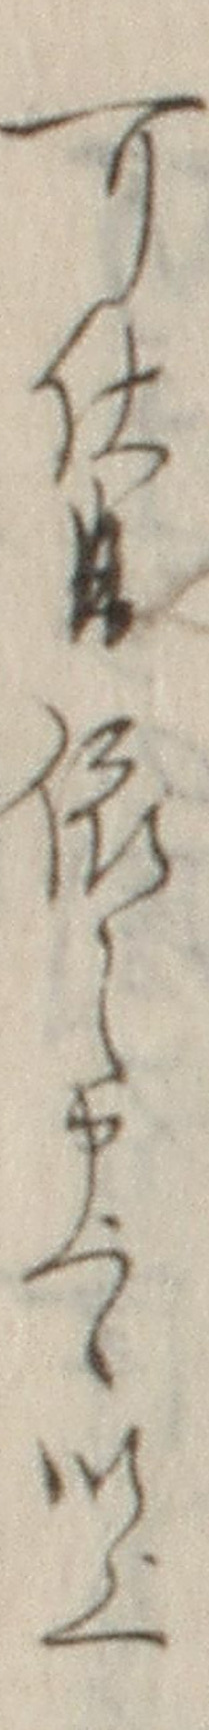可仕候依之申上候以上
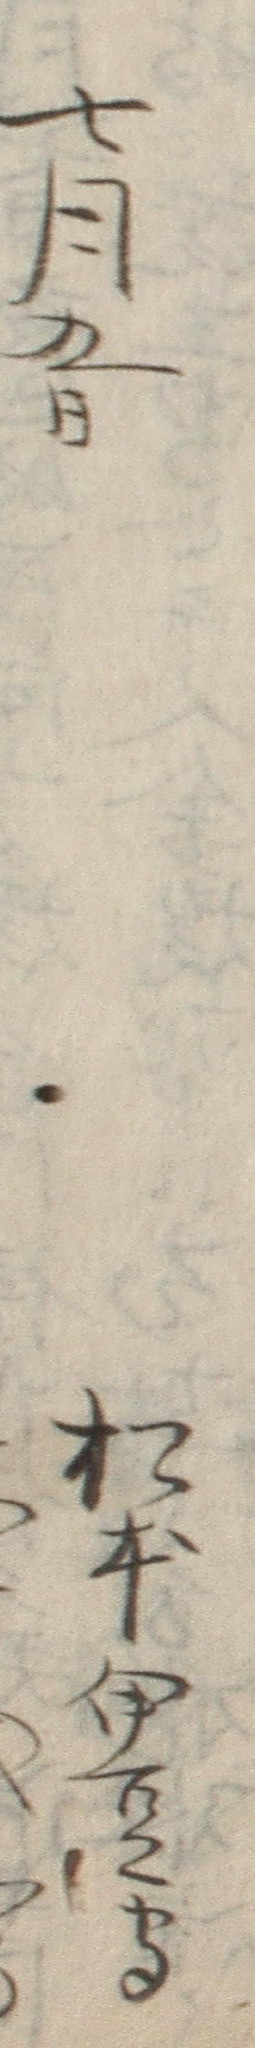七月九日松本伊豆守
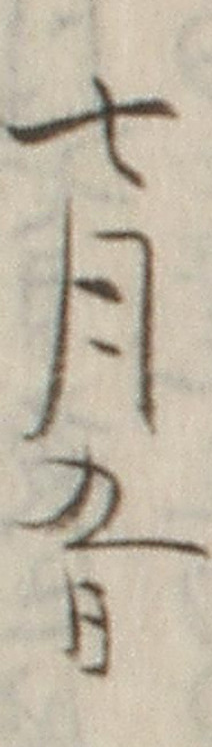七月九日
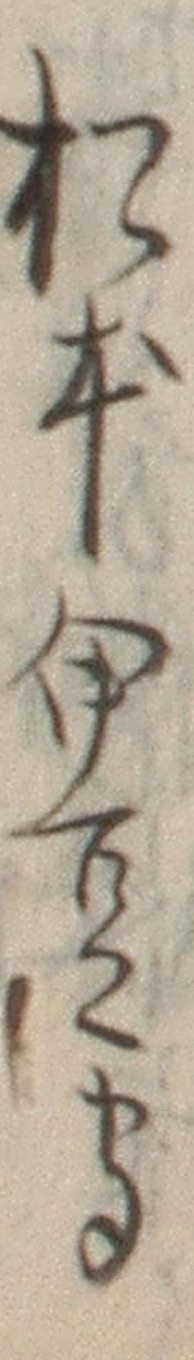松本伊豆守
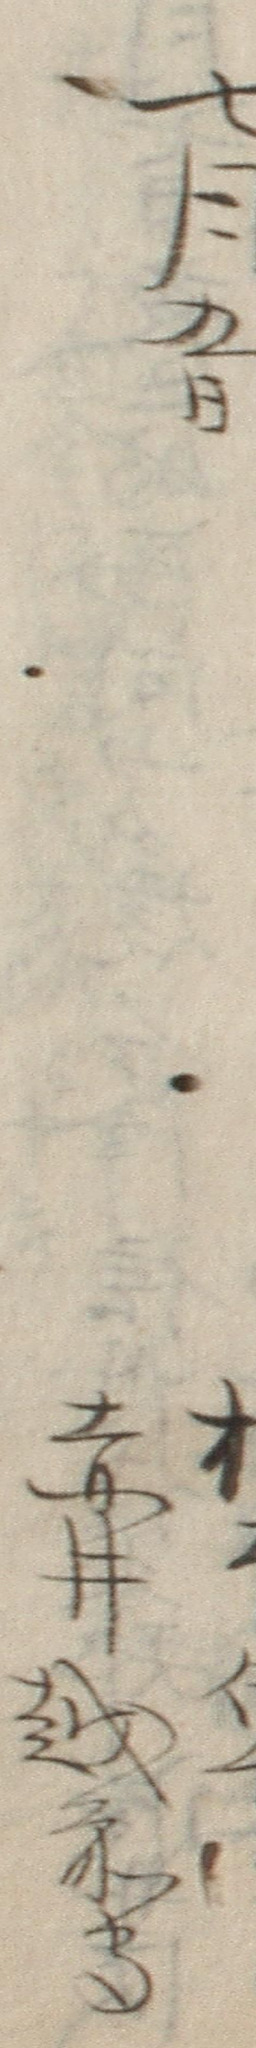赤井越前守
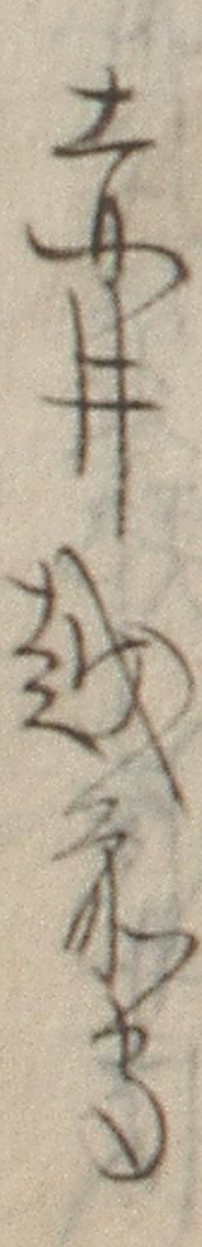赤井越前守

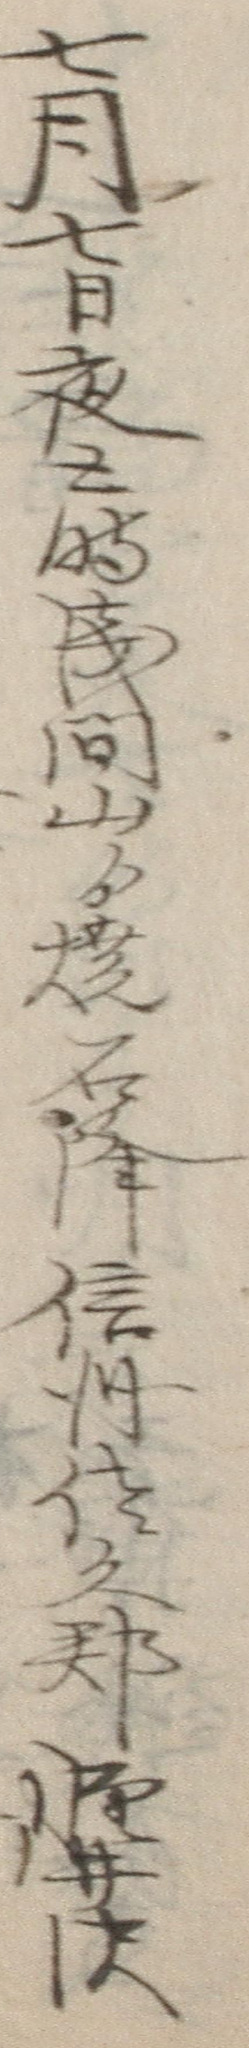七月七日夜五時浅間山ゟ焼石降信州佐久郡軽井沢
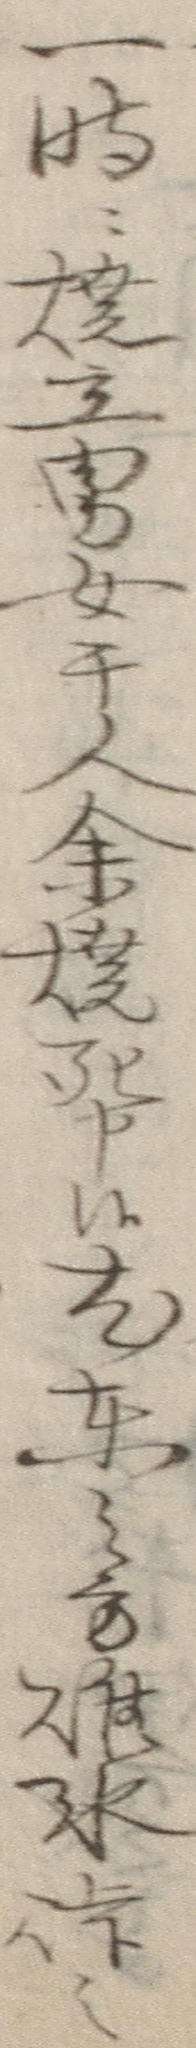一時ニ焼立男女千人余焼死申候尤東之方碓氷峠之
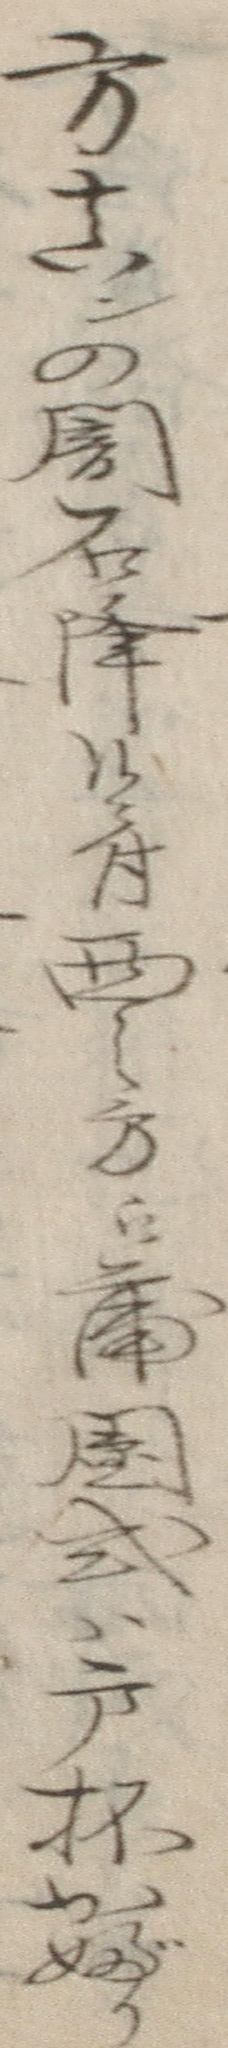方真ンの闇石降候ニ付西之方え蒲団或ハ戸等かぶり
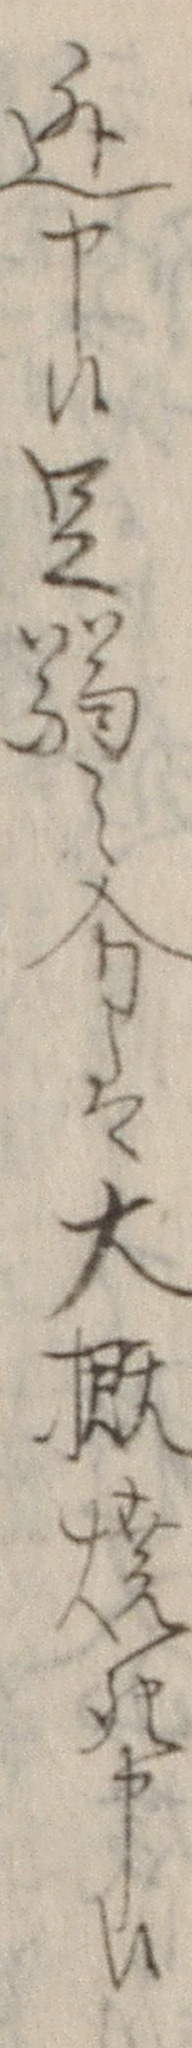逃申候足弱之分は大概焼死申候
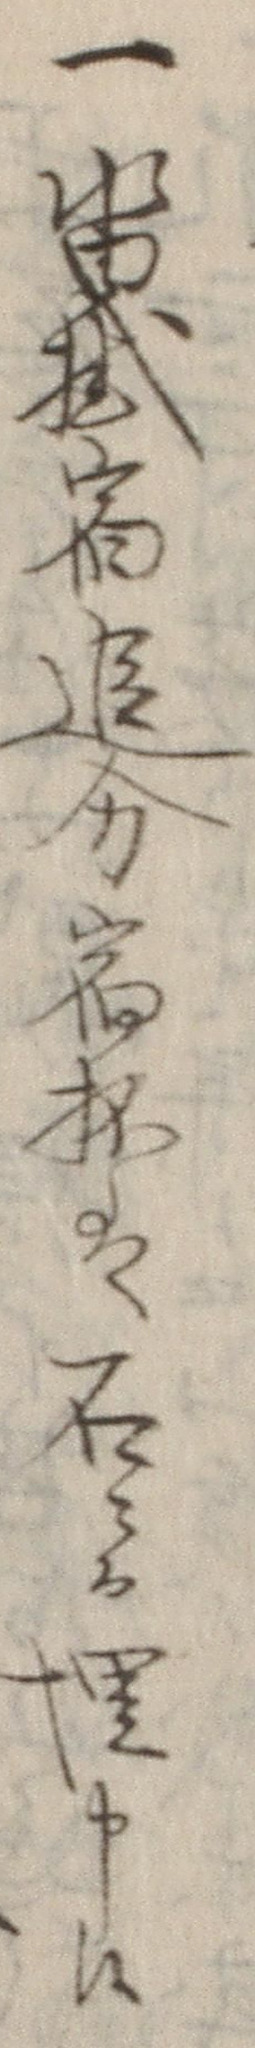一沓掛宿追分宿抔は石ニ而埋申候
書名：[諸国災害記録]
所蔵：東京大学地震研究所図書室 Earthquake Research Institute Library, The University of Tokyo, JAPAN
